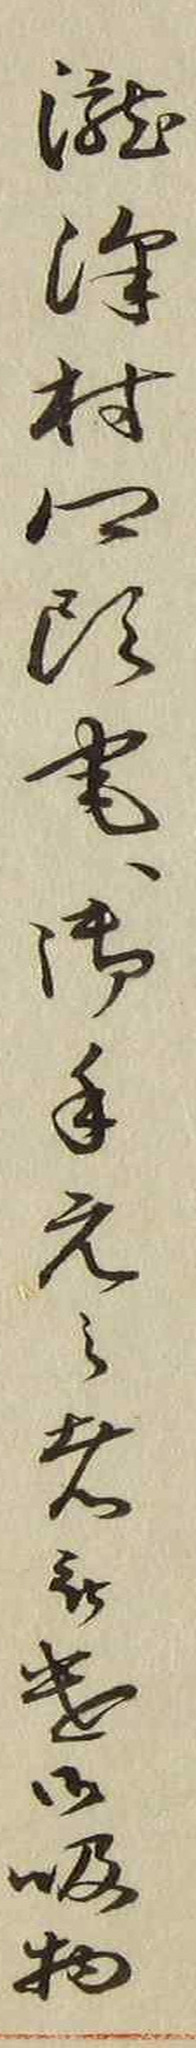瀧澤村郷頭宅へ御手元之者被遣御吸物
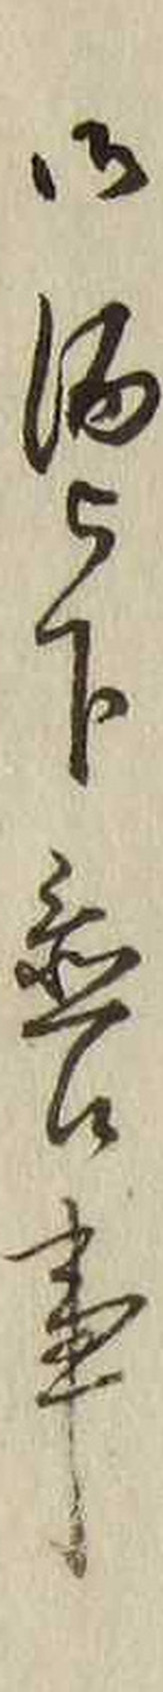御酒被下置候事
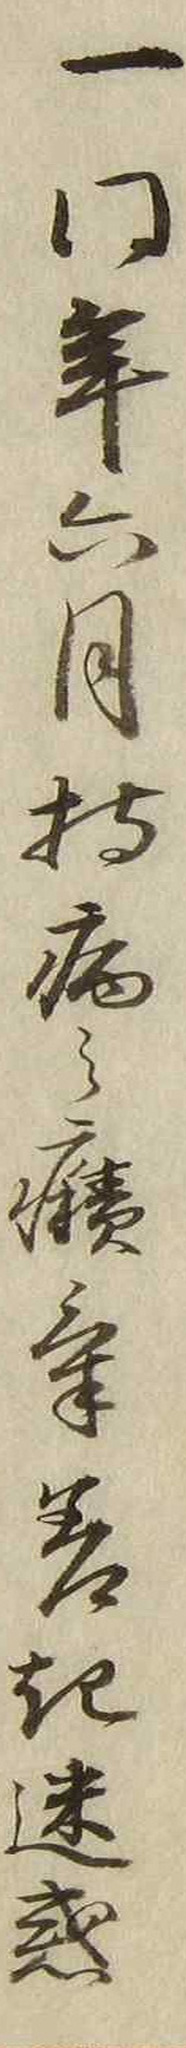一同年六月持病の癪気差起迷惑
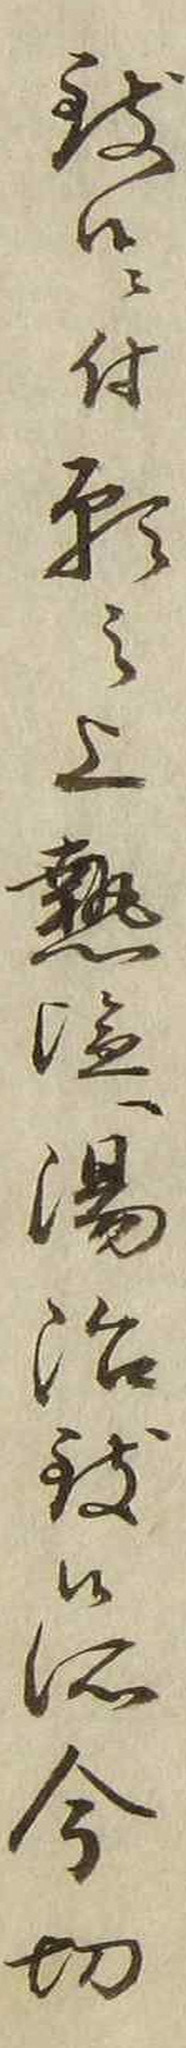致候に付願之上熱塩へ湯治致候所今切

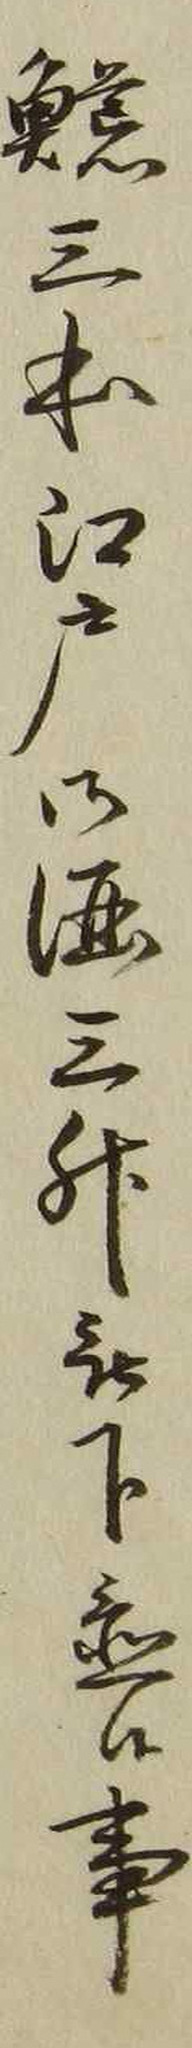三本江戸御酒三升被下置候事
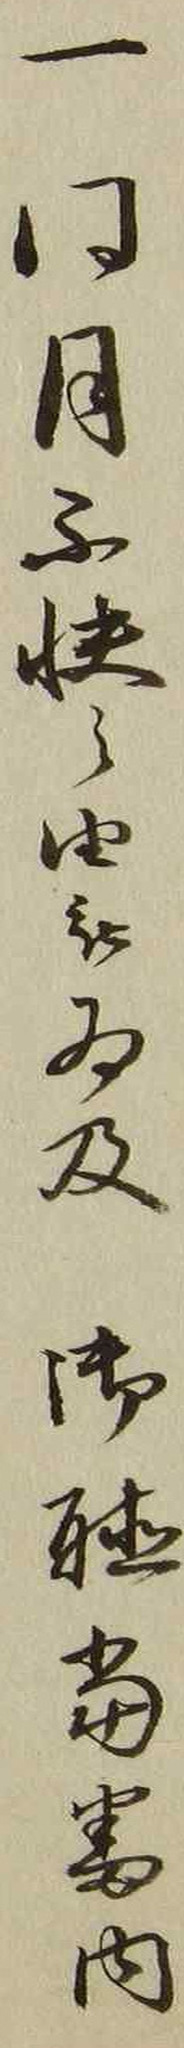一同月不快之由被為及御聴当番内
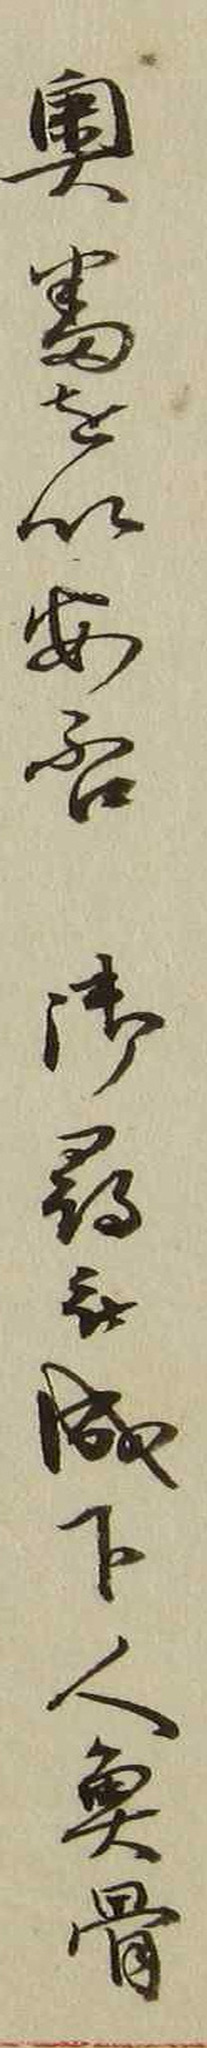奥番を以安否御尋被成下人魚骨
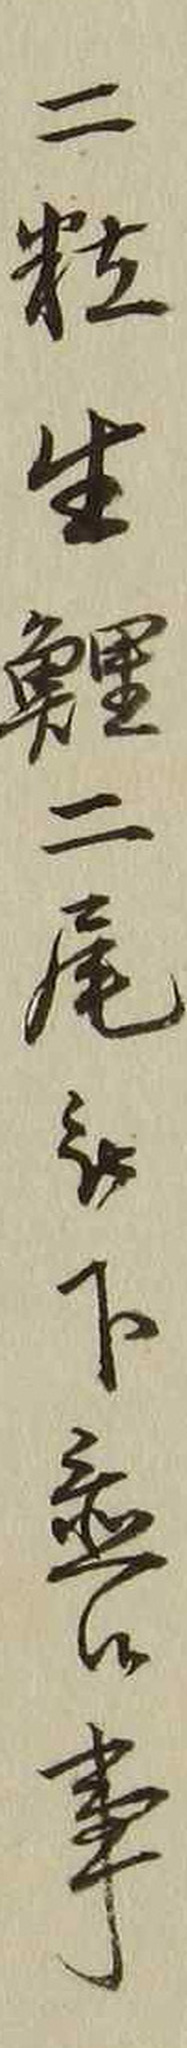二粒生鯉二尾被下置候事
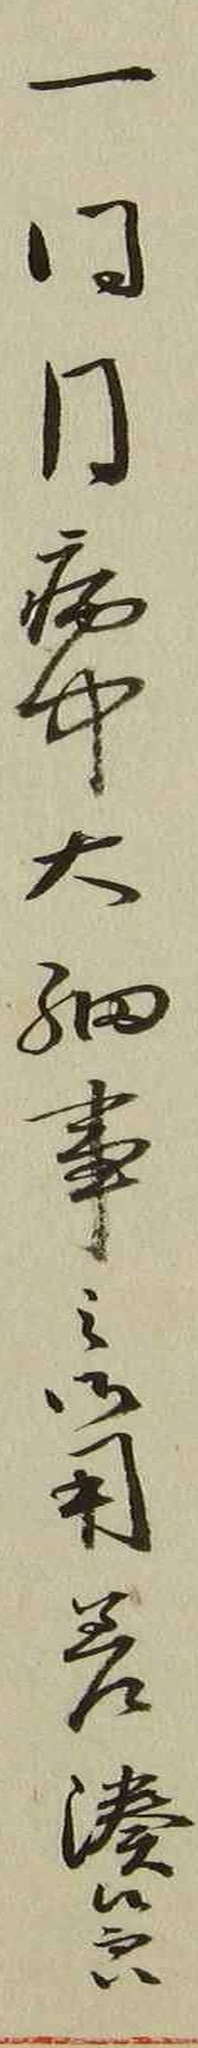一同月病中大細事之御用差湊候而は
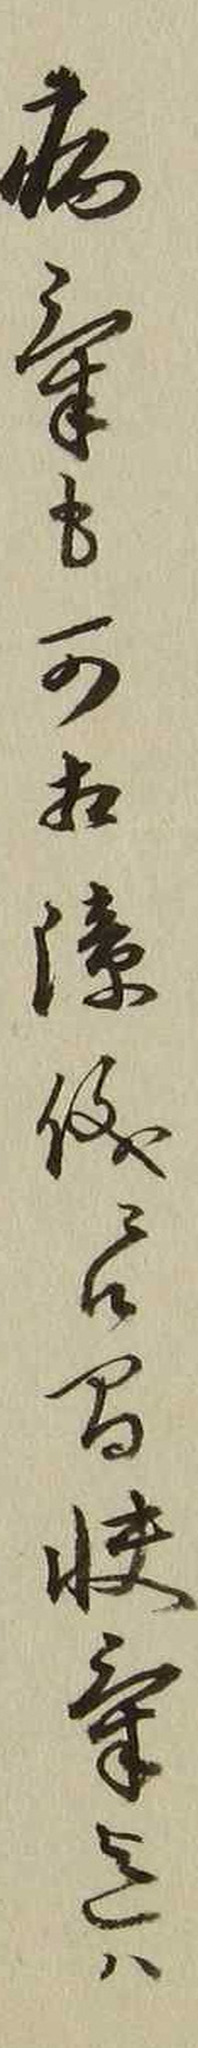病気も可相障儀に候間快気迄は
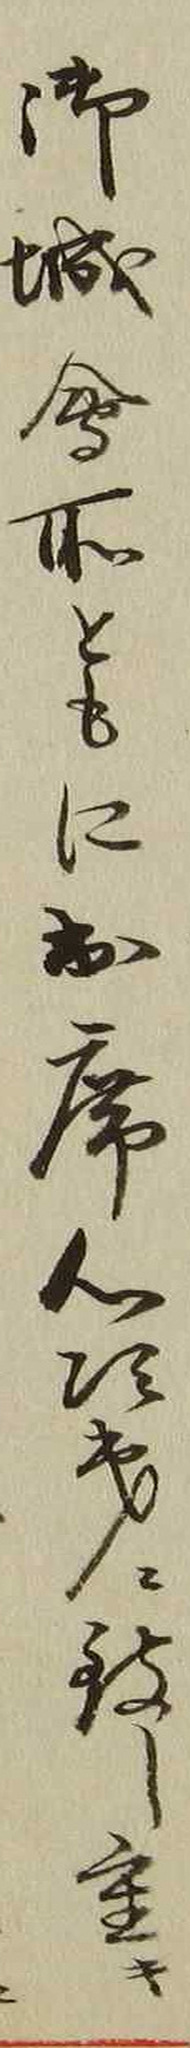御城会所ともに出席心次第に致重き
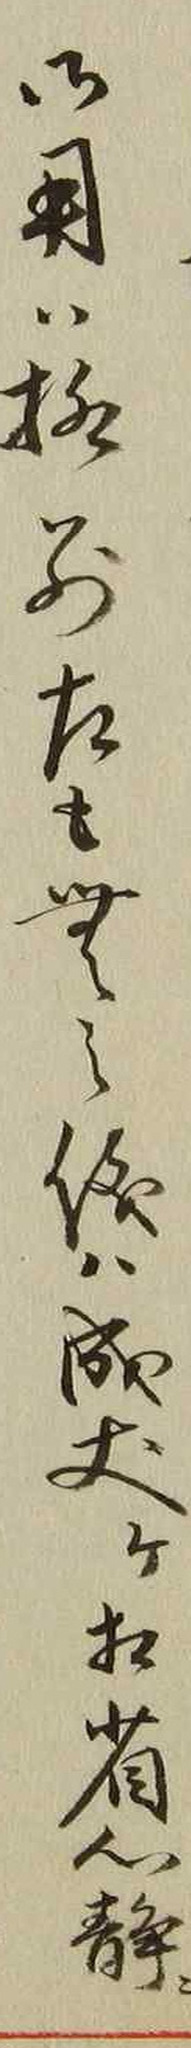御用は格別左も無之儀は成丈け相省心静に
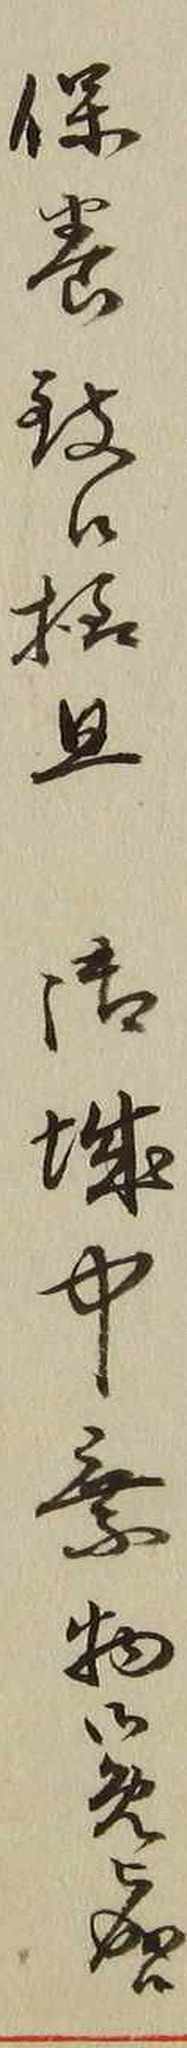保養致候様且御城中乗物御免被成候
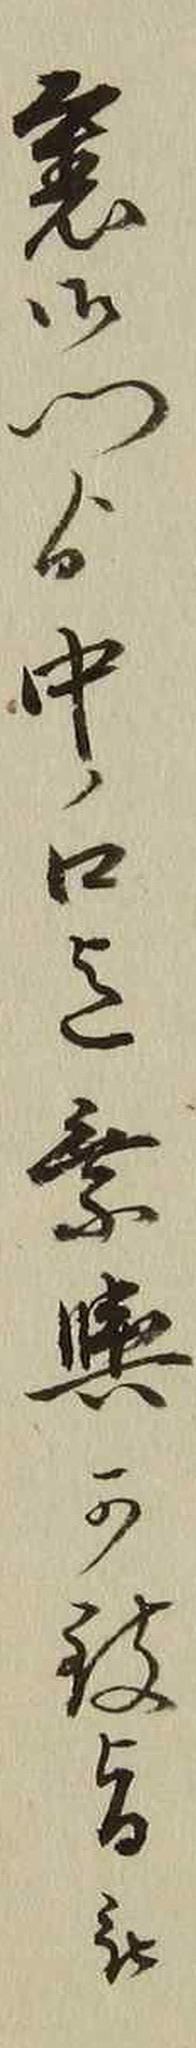悉御門ゟ中ノ口迄乗輿可致旨被
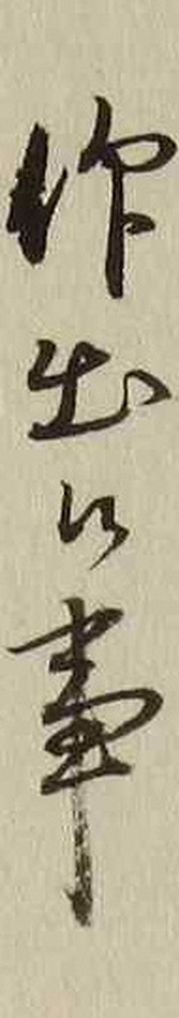仰出候事
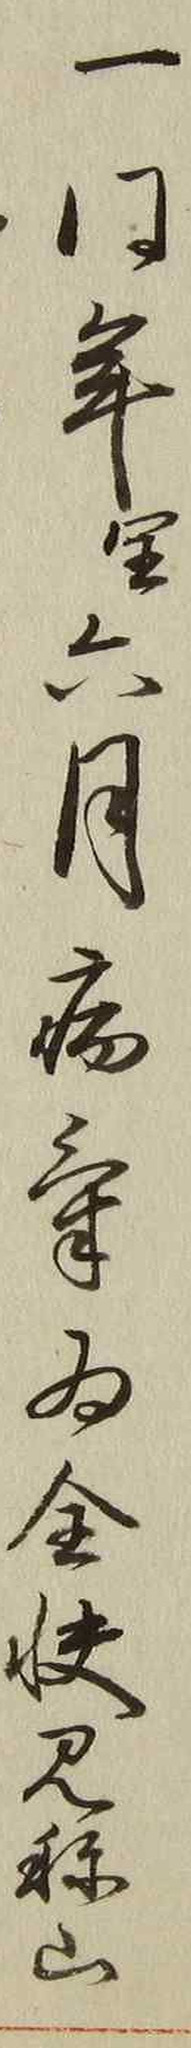一同年閏六月病気為全快見祢山
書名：諸士系譜　巻之125　た之部1
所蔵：会津若松市立会津図書館
